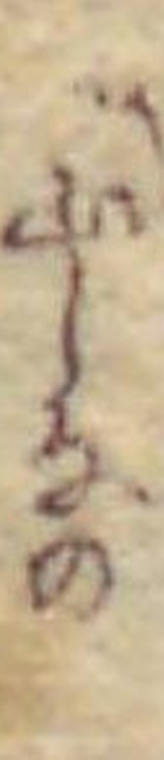〽山しなの
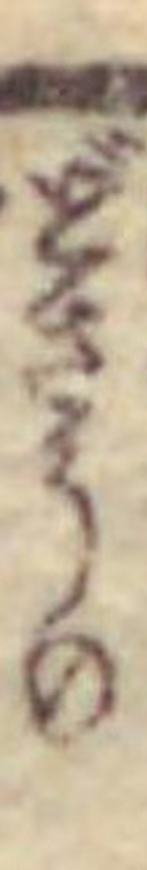どさうの
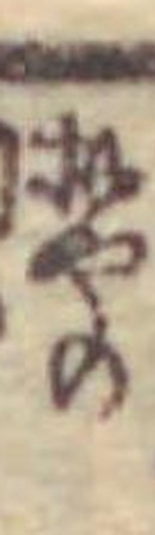おやの
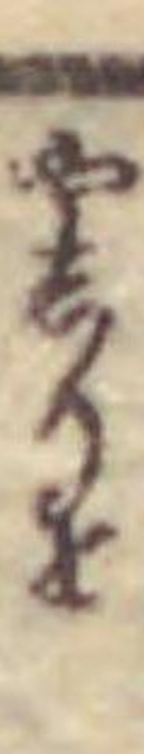やしりを
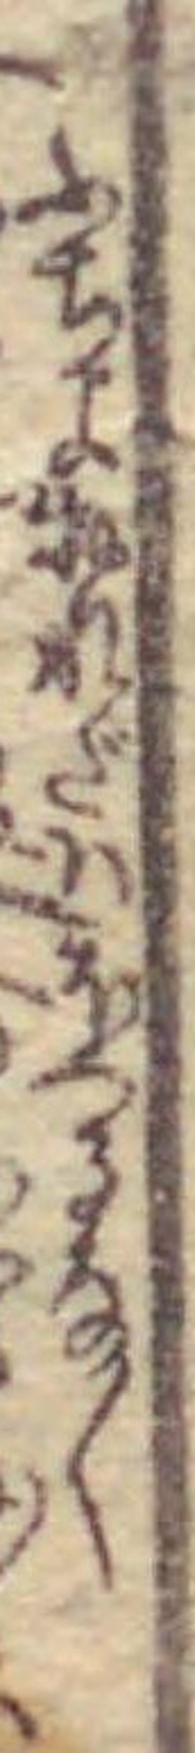ふちよおれだはほへるな〳〵

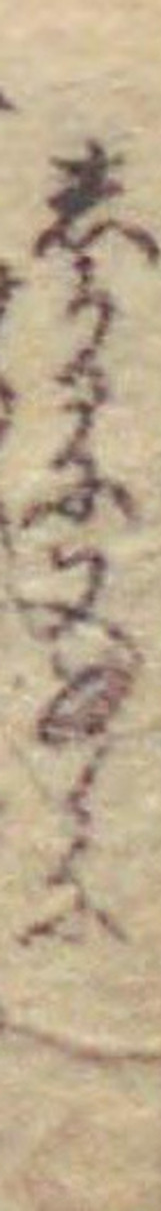しかるに又こゝに
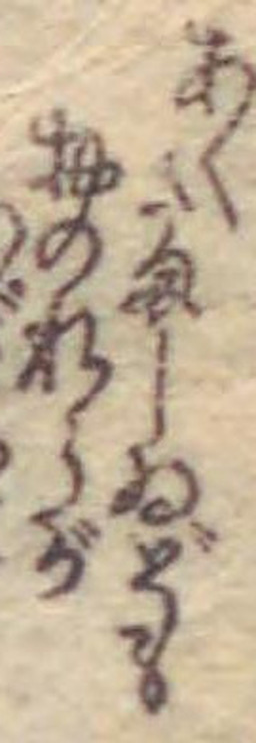おのれらが
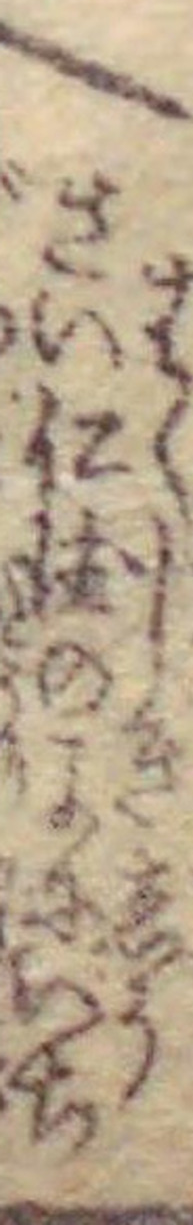さい仁徳のよにいち
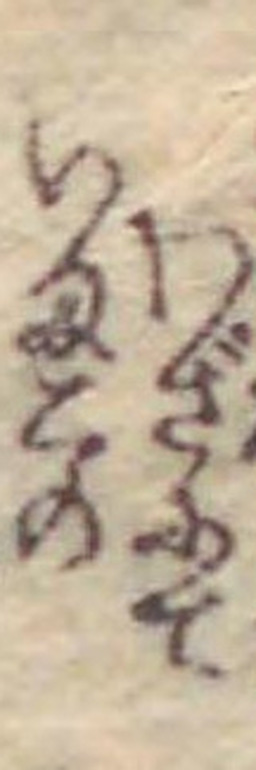いまこの
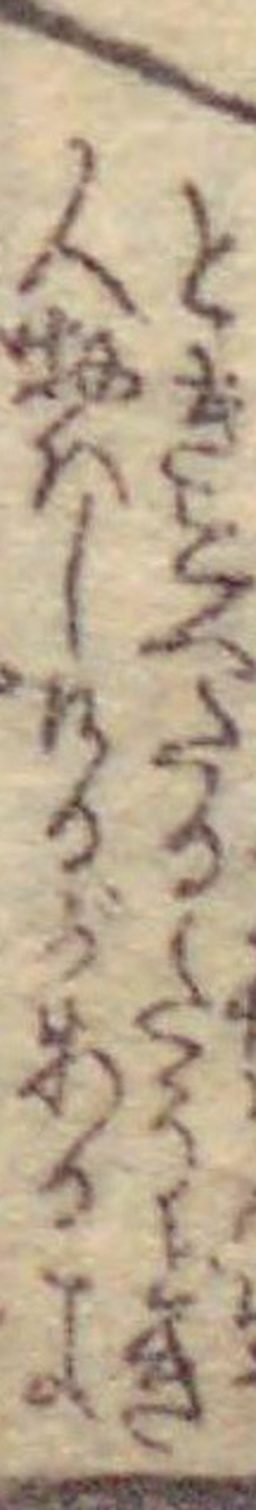人おはしけるがあるよ
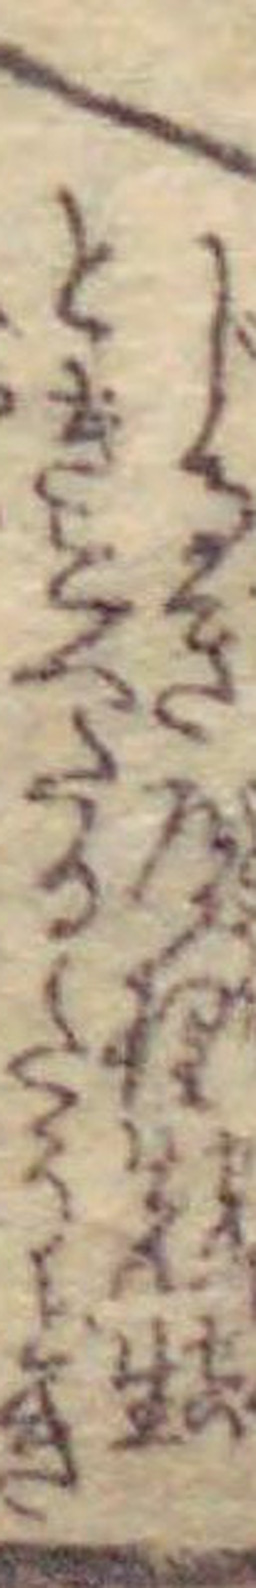ときこへたるとうとき
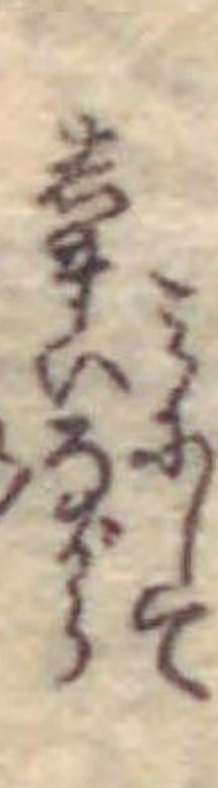しまいながら
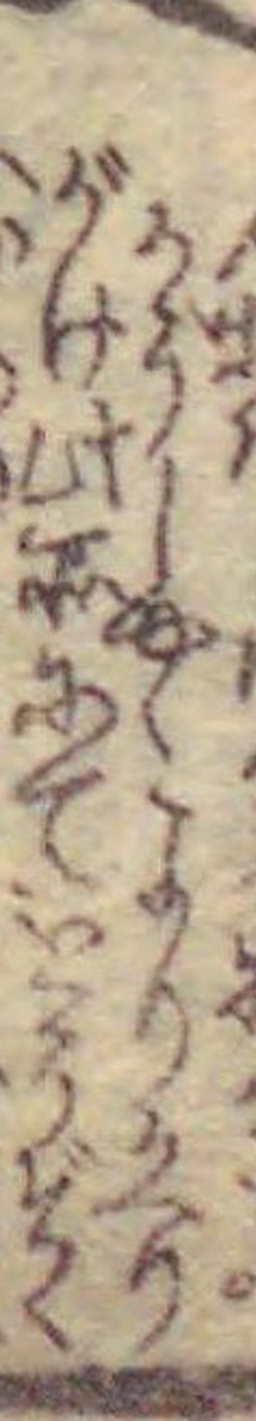がけ此所にてとうぞ
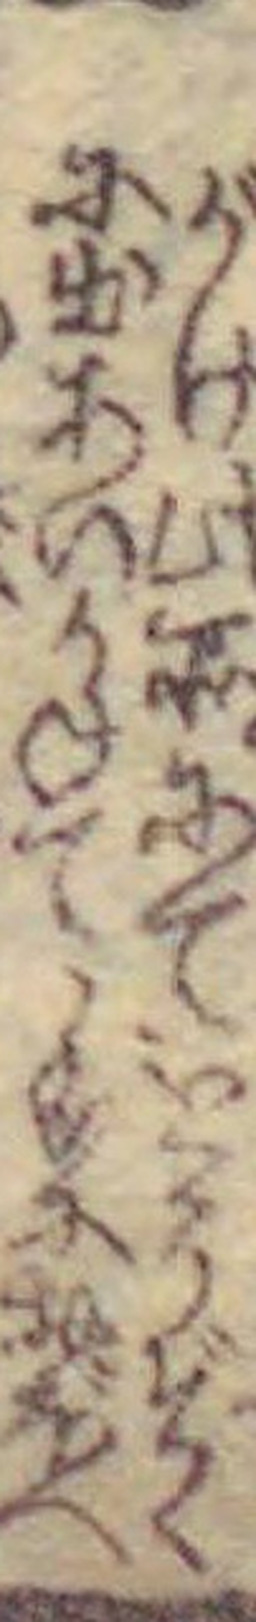に出あいかねて手におぼへ
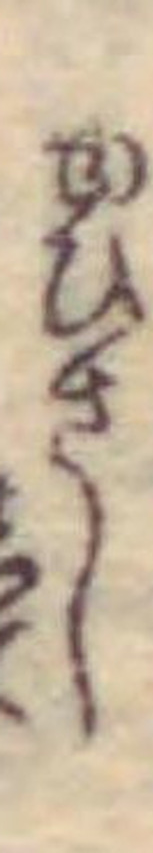ゆひさし
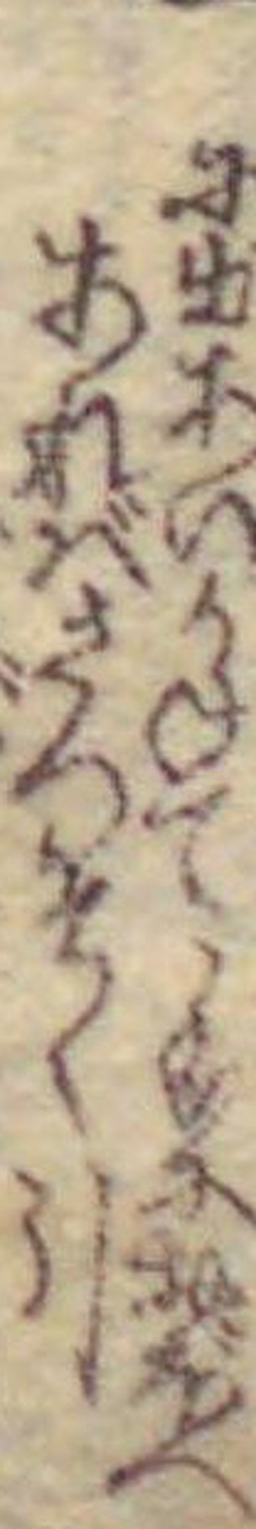あればさつそく引
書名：心学早染艸 : 3巻
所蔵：国立国会図書館 National Diet Library, JAPAN
